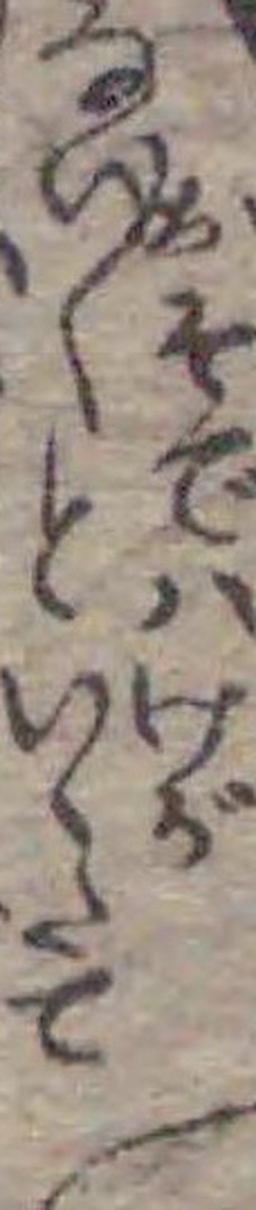ない〳〵といゝたて
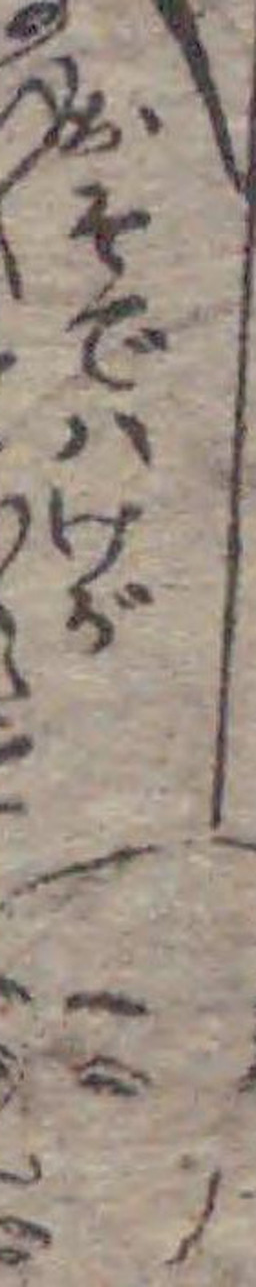おそではけが
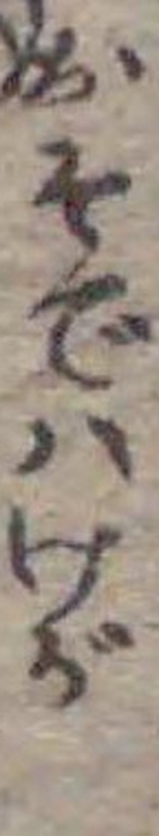おそではけが
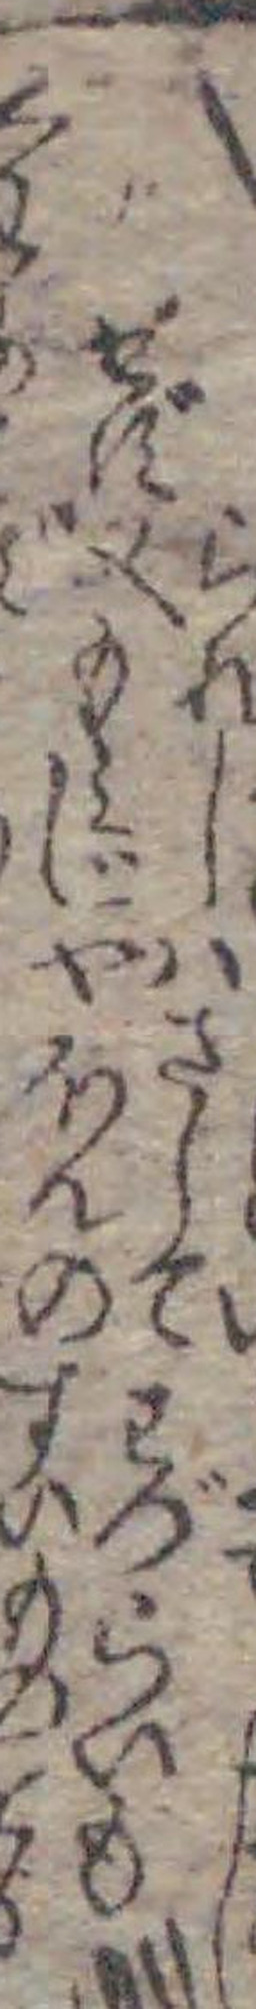せず又もみじやほんのすいものをも
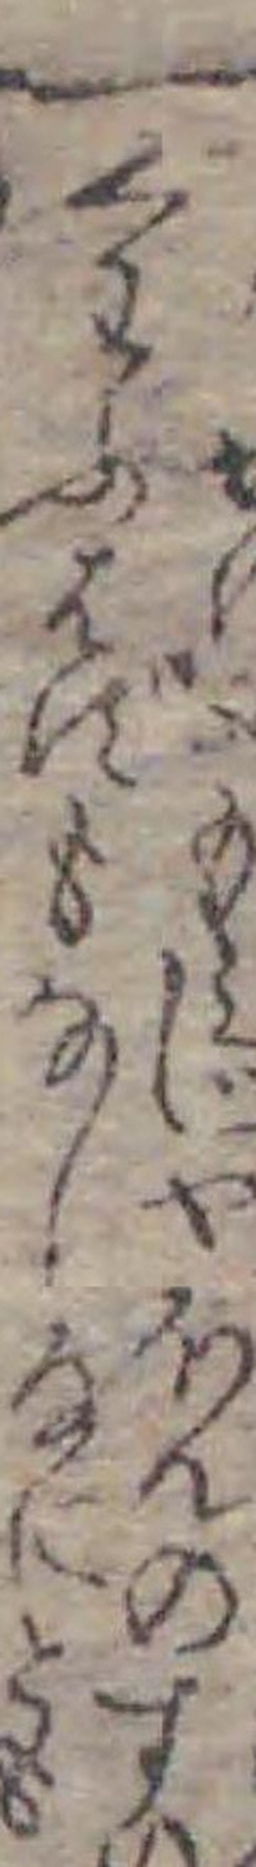くわふはずもなしなにとも
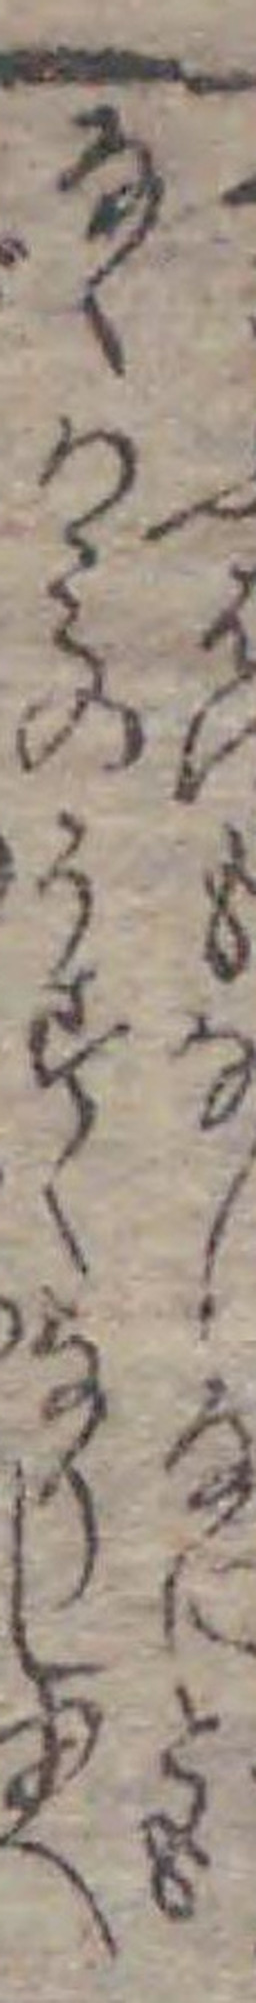なくかみのうすくなりしゆへ
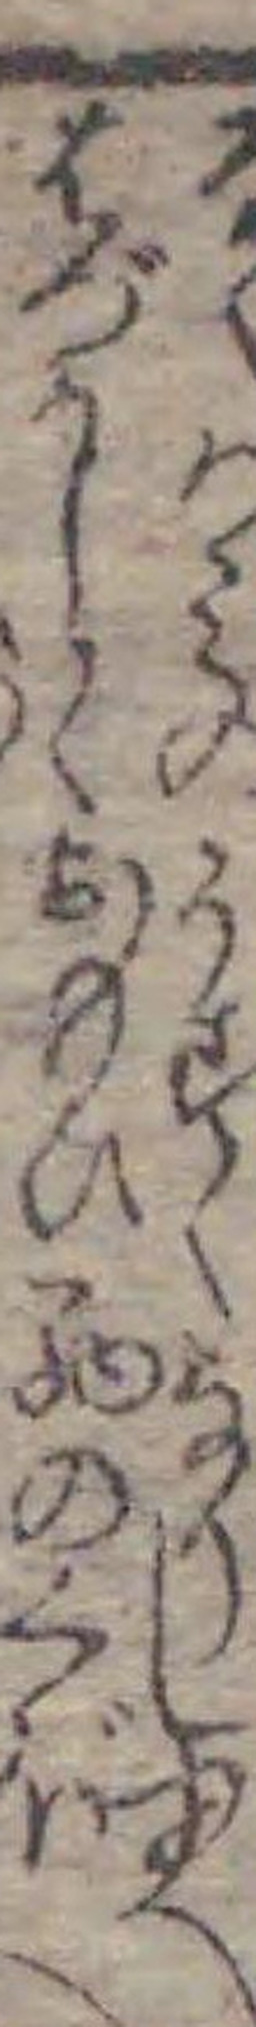はづかしくおもひ西のくぼ
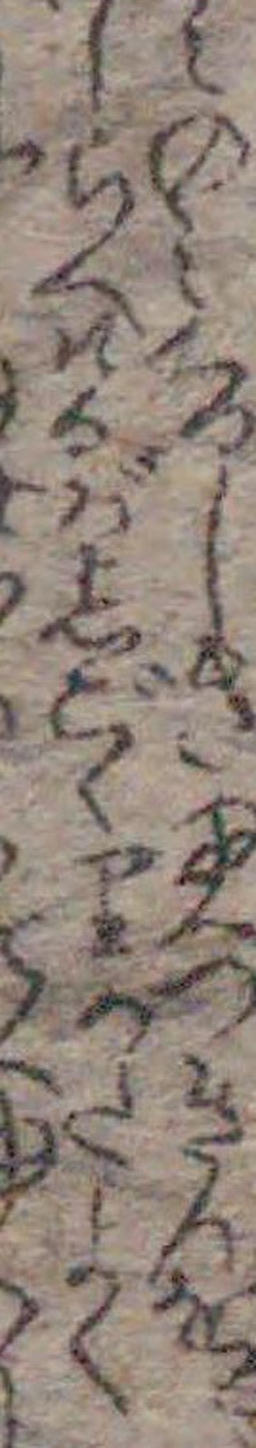こしらへけるがしごくりかたよく
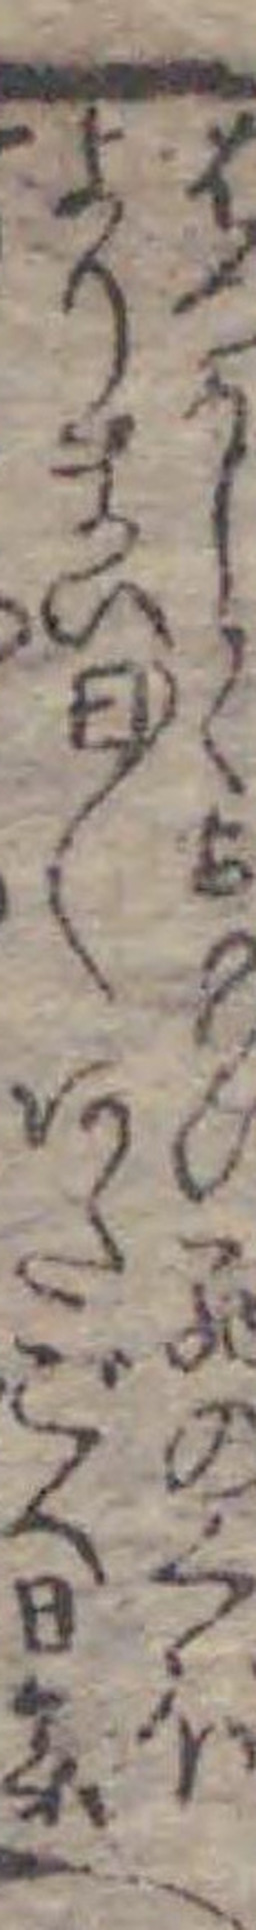よりまい日〳〵あたごへ日参
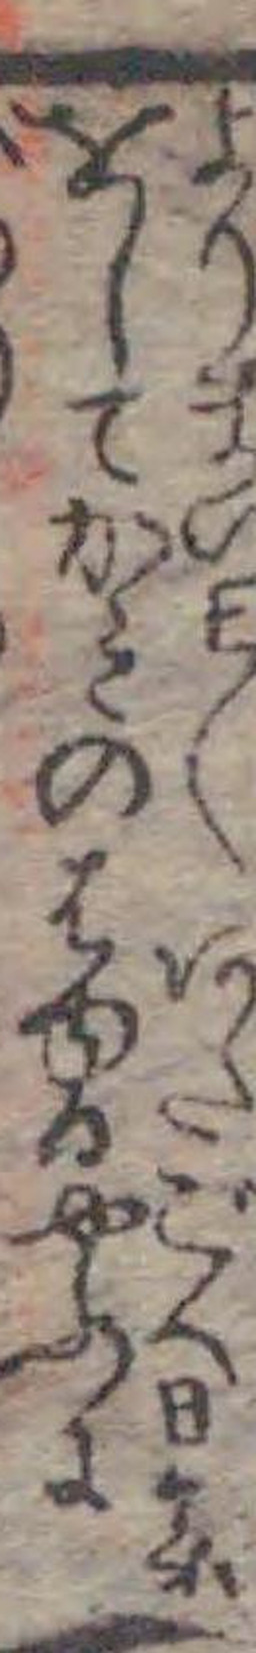をしてかみのはゆるやふに
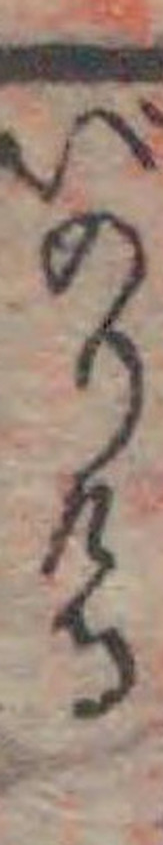いのりける
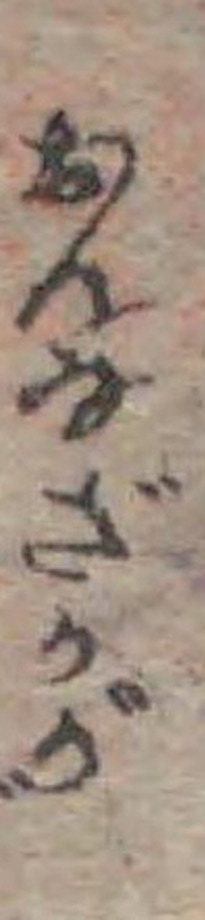おんなざかが
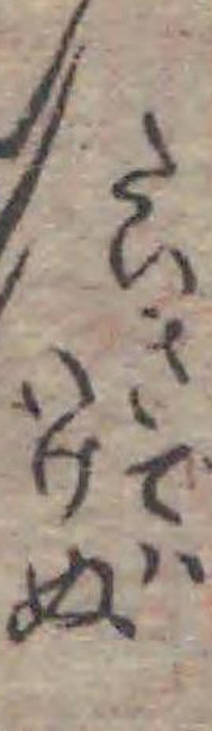いけぬ
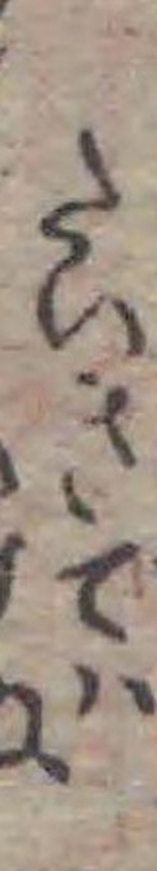たいきでは
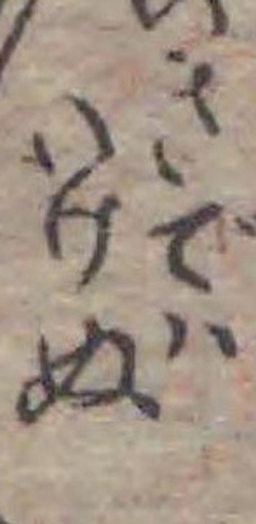いけぬ
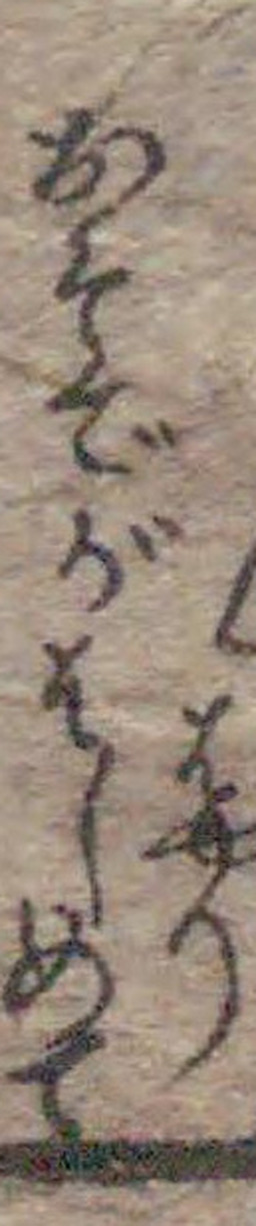おそでがはしめて
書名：神田与吉一代記 : 3巻
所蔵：国立国会図書館 National Diet Library, JAPAN
